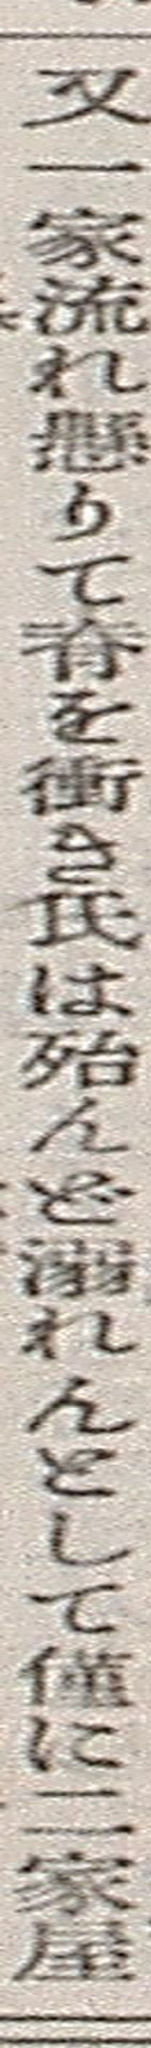又一家流れ懸りて背を衝き氏は殆ど溺れんとして僅に二家屋
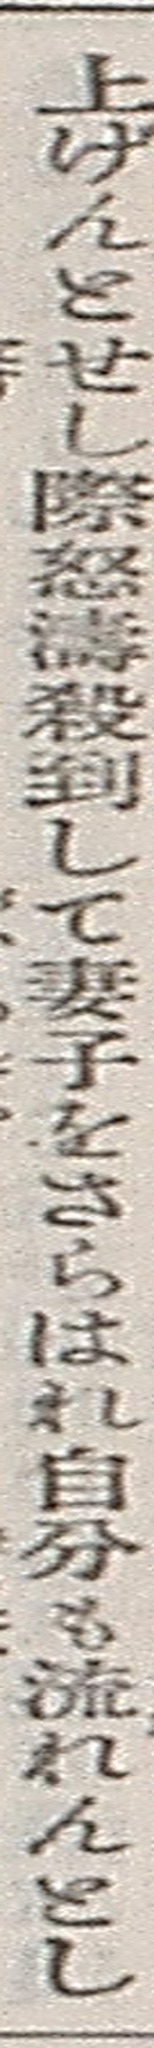上げんとせし際怒濤殺到して妻子をさらはれ自分も流れんとし
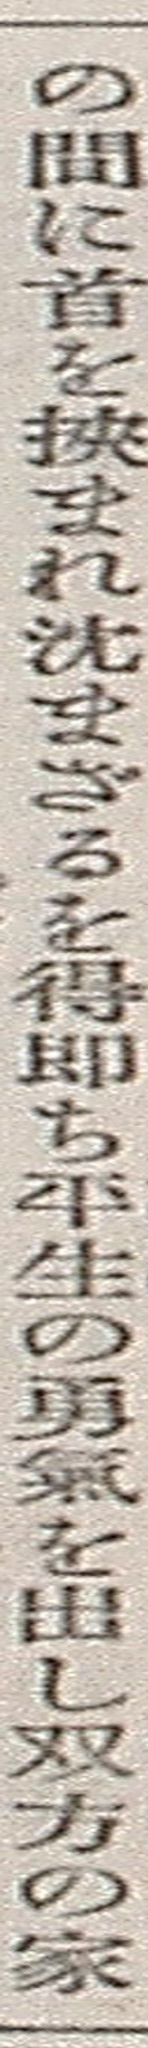の間に首を挟まれ沈まざるを得即ち平生の勇気を出し双方の家
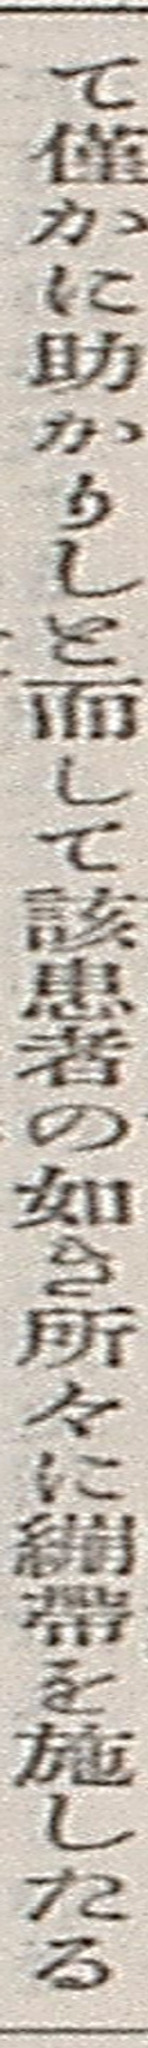て僅かに助かりしと而して該患者の如き所々に包帯を施したる
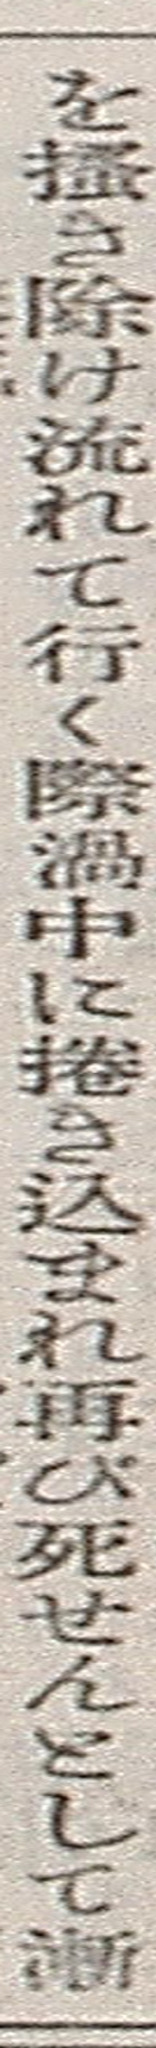を掻き除け流れて行く際渦中に捲き込まれ再び死せんとして漸
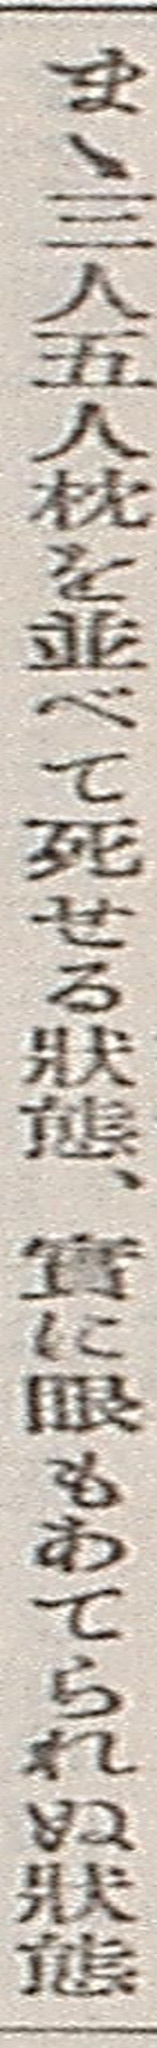まゝ三人五人枕を並べて死せる状態、実に眼もあてられぬ状態
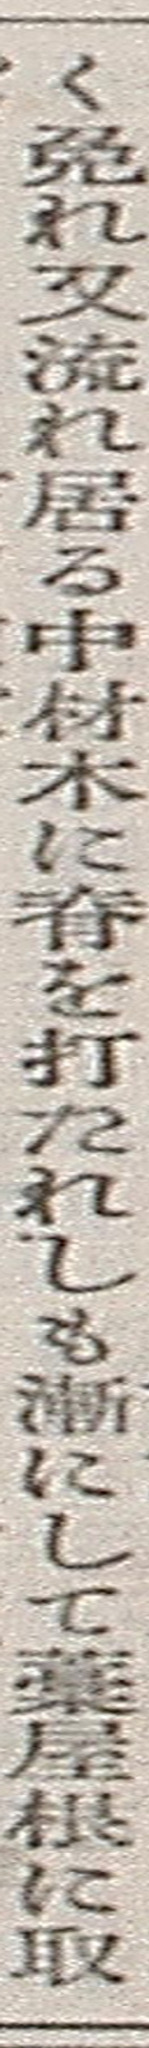く免れ又流れ居る中材木に背を打たれしも漸にして藁屋根に取
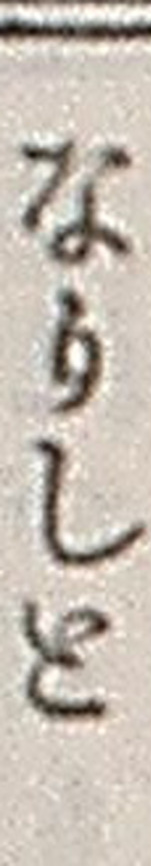なりしと
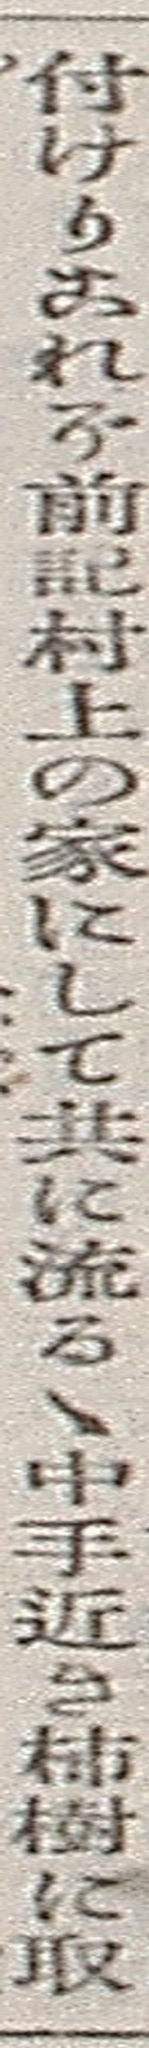付けりこれぞ前記村上の家にして共に流るゝ中手近き柿樹に取
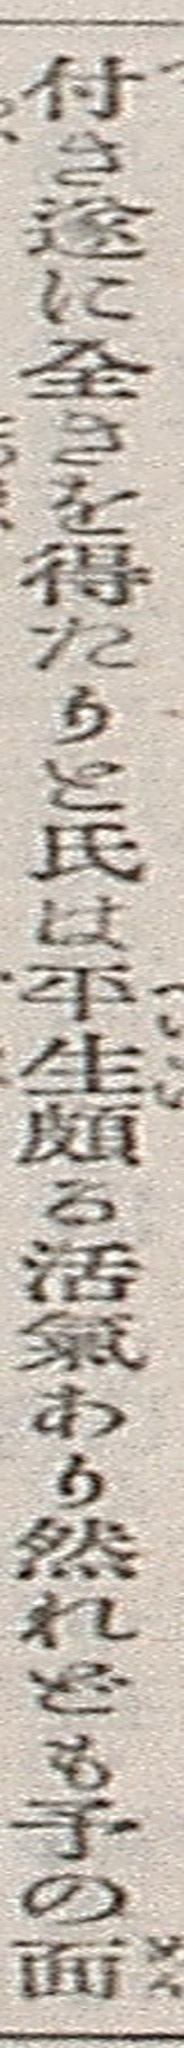付き遂に全きを得たりと氏は平生頗る活気あり然れども予の面
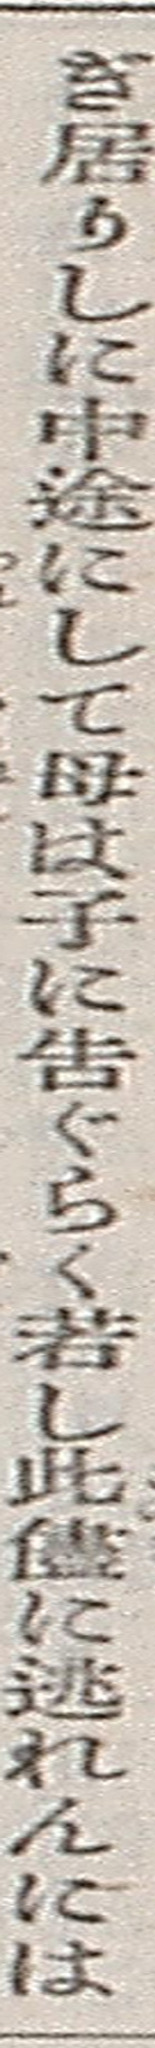ぎ居りしに中途にして母は子に告ぐらく若し此儘に逃れんには
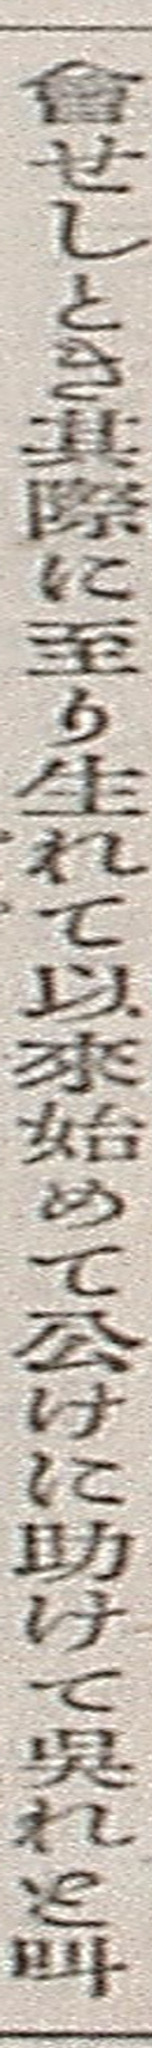会せしとき其際に至り生れて以来始めて公けに助けて呉れと叫
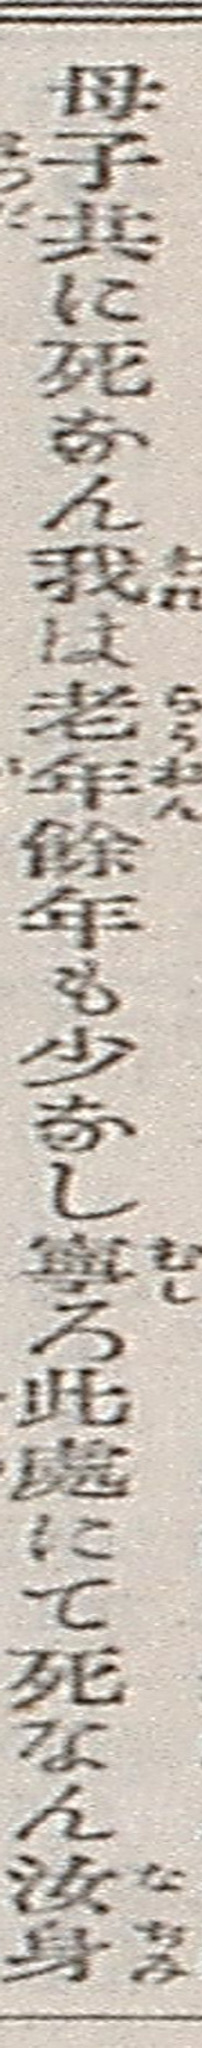母子共に死なん我は老年餘年も少なり寧ろ此処にて死なん汝身
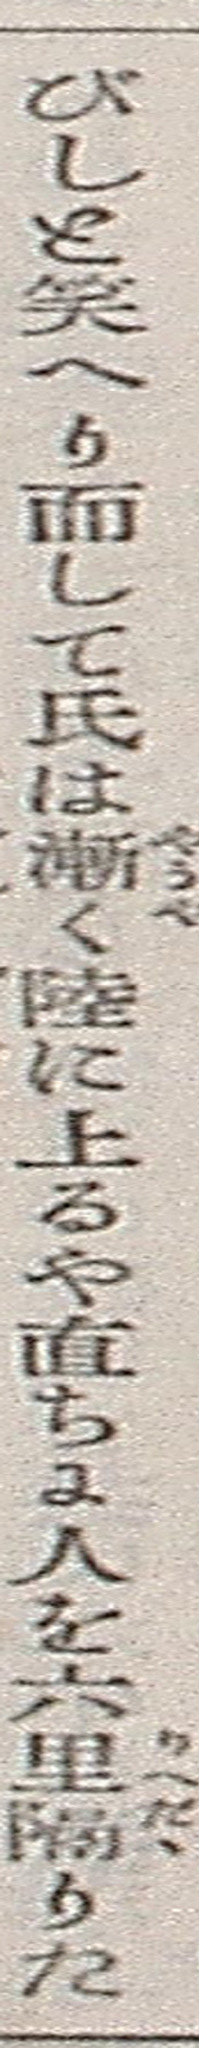ぎしと笑へり而して氏は漸く陸に上るや直ちに人を六里隔りた
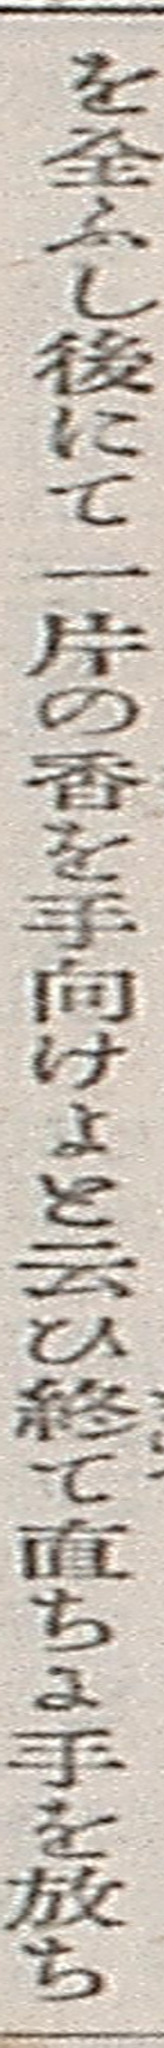を全ふし後にて一片の香を手向けよと云ひ終て直ちに手を放ち
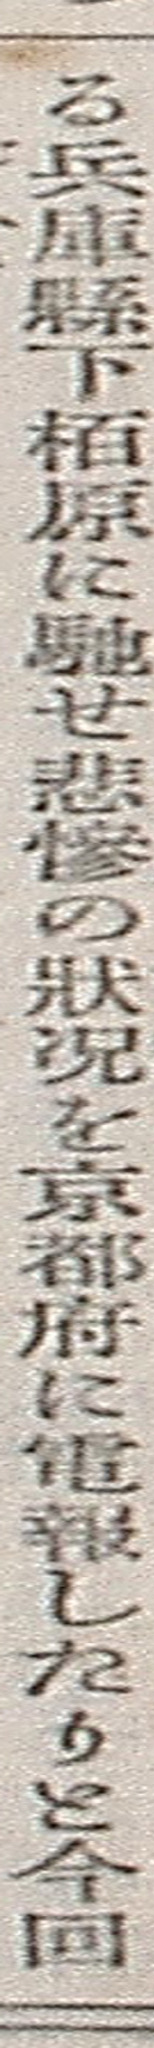る兵庫縣下栢原に馳せ悲惨の状況を京都府に電報したりと今回
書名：風俗畫報臨時増刊第百二十六號　洪水被害録（中）
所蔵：東京大学地震研究所図書室 Earthquake Research Institute Library, The University of Tokyo, JAPAN
